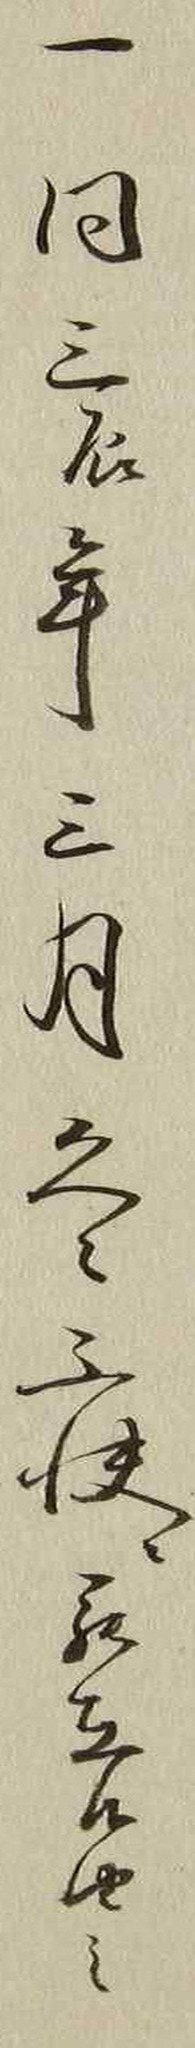一同三辰年三月久々不快罷在候由之
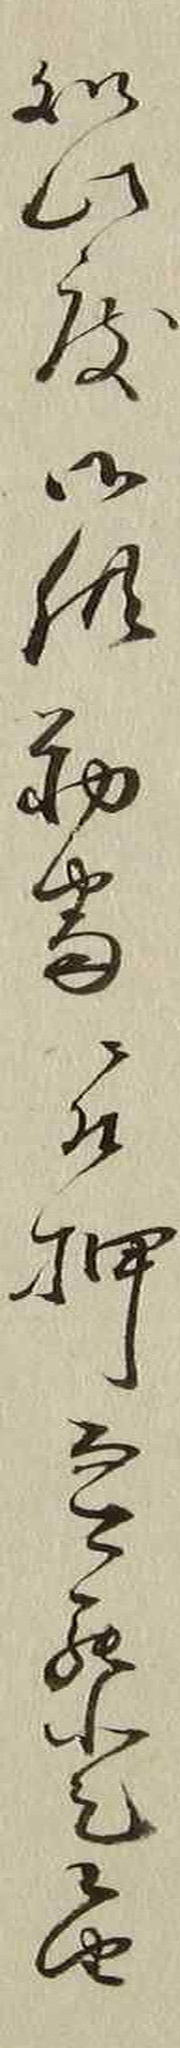処此度御供勤番ニ付押而罷登候由
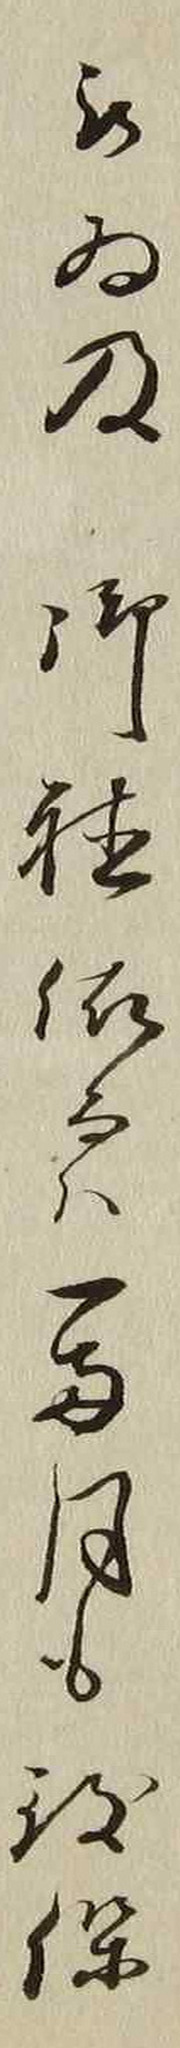被為及御聴依而ハ一両月も致保
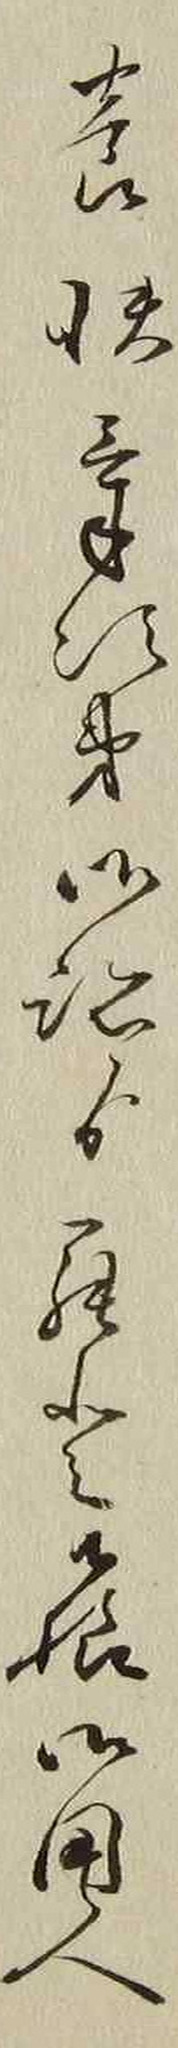養快気次第御跡ゟ罷登候様御用人
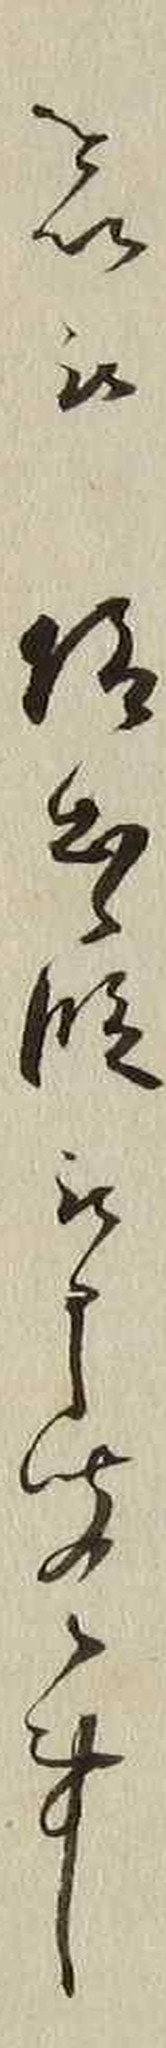を以被仰出候段被申聞候事
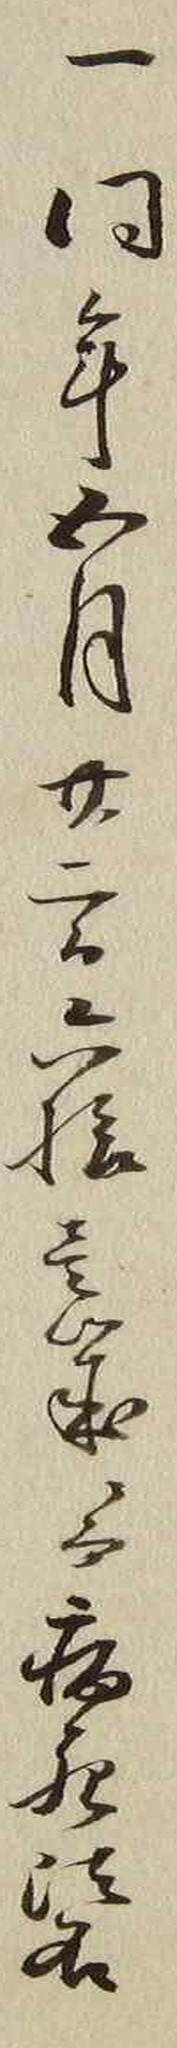一同年五月廿二日六拾壱歳ニ而病死法名
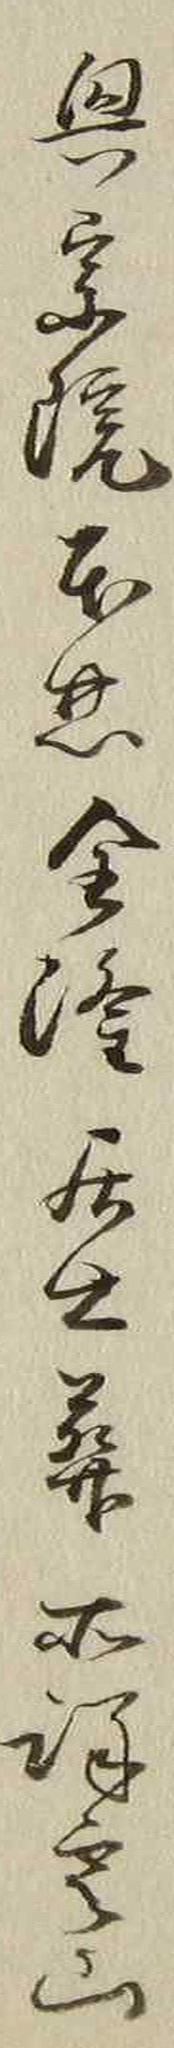興宗院本忠全隆居士葬所詳雲山
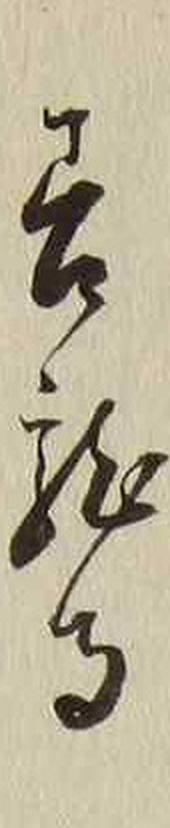善龍寺
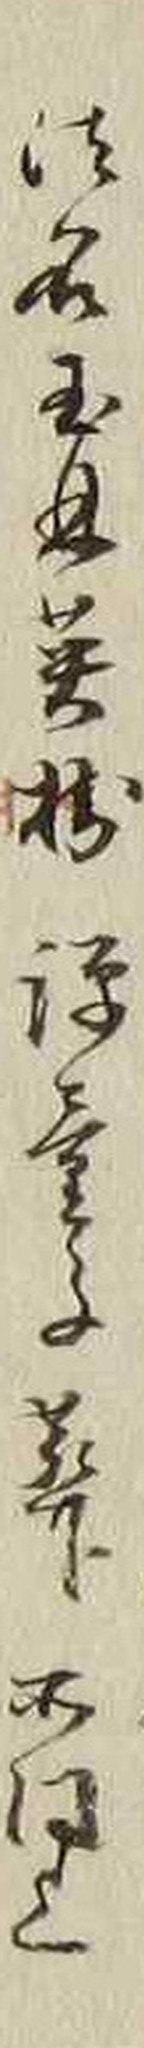法名玉林英樹評童子葬所同上
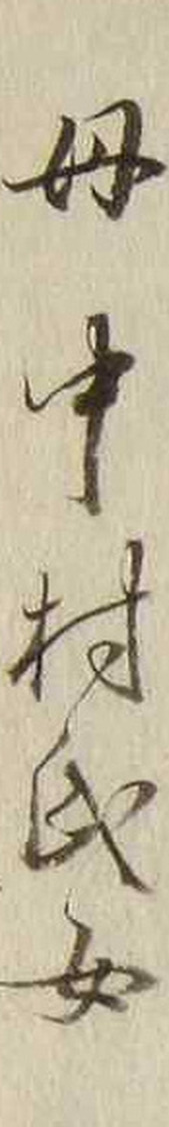母中村氏女

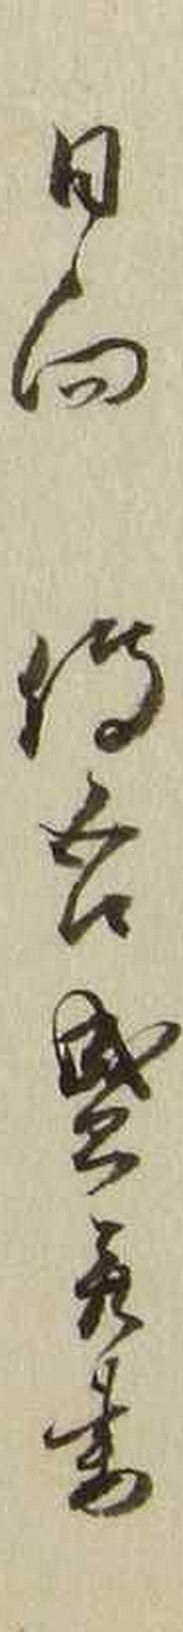日向伝吾盛喜妻
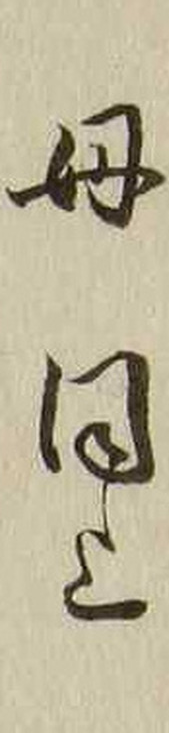母同上
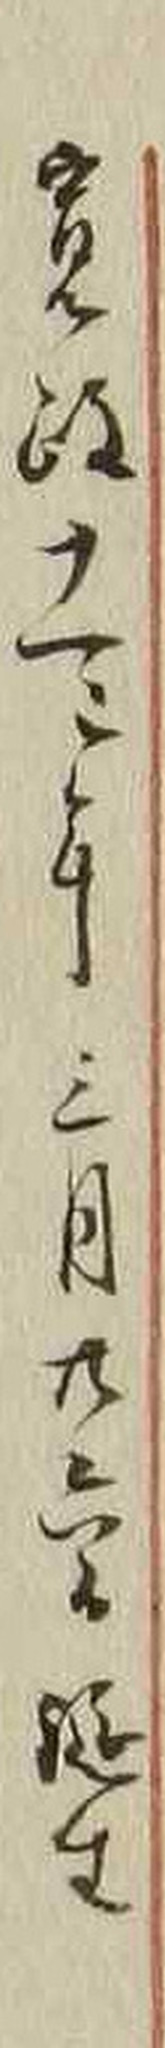寛政十一巳年三月廿六日誕生
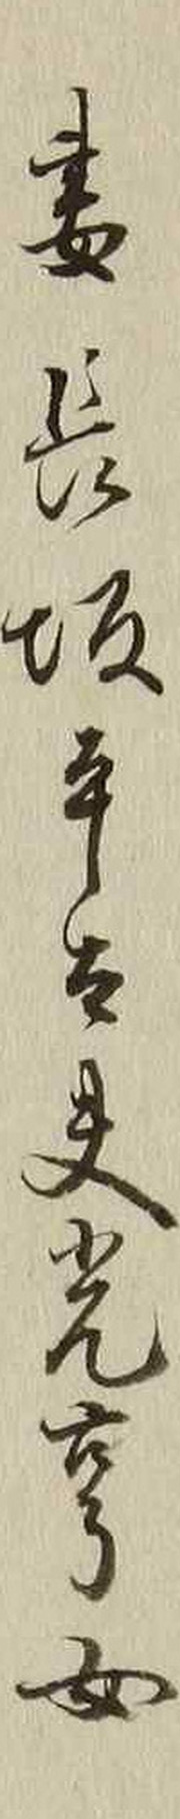妻長坂平太夫光亭女
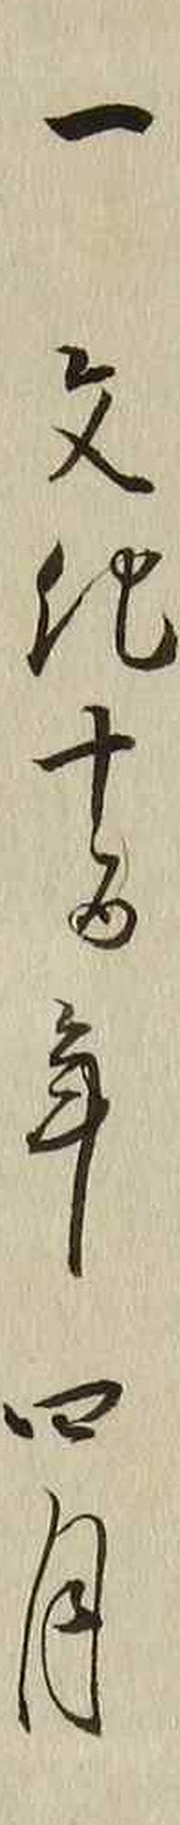一文化十酉年四月
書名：諸士系譜　巻之25　い之部25
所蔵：会津若松市立会津図書館
